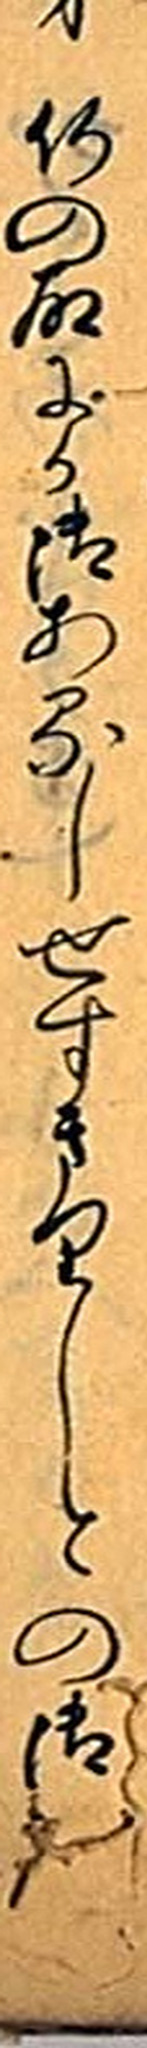弟何の故にか御あるしせすきりしとの御
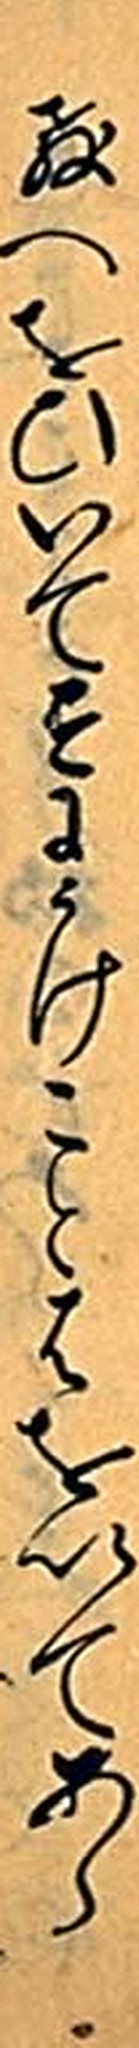教へをいひてすにうけことはを以てあら
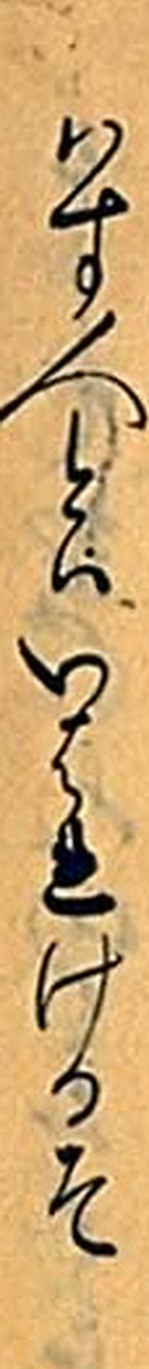はす人とはいはれけるそ
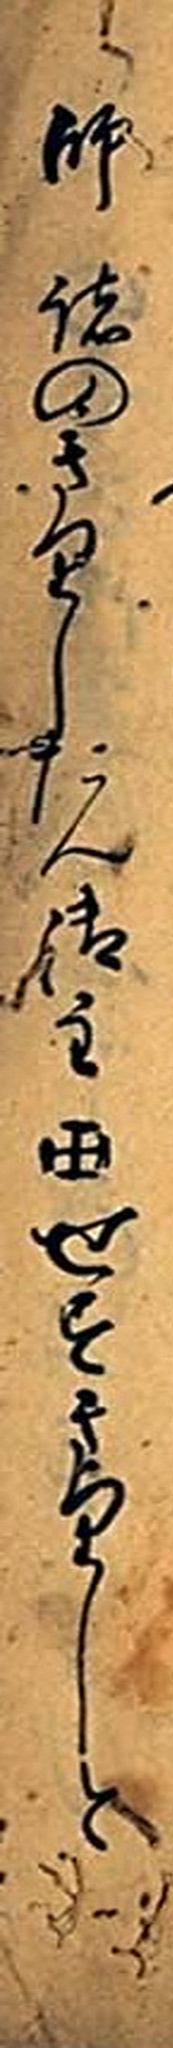師諸のきりしたん御主☩せすきりしと

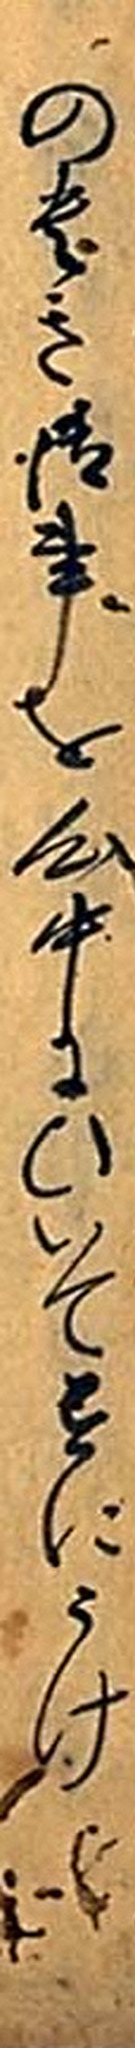の貴き御事を心中にひいてすにうけ
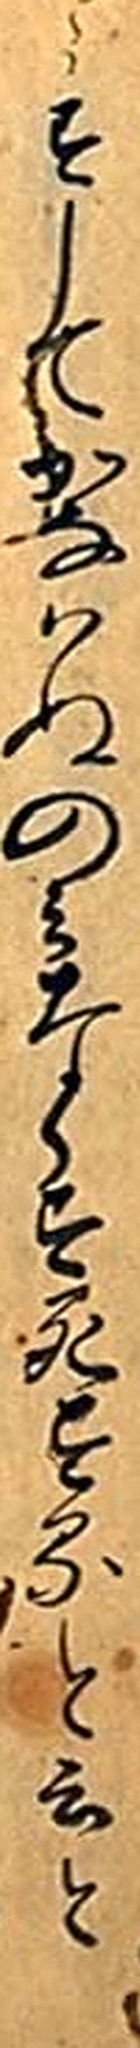すしてかなはぬのみならす死すると云と
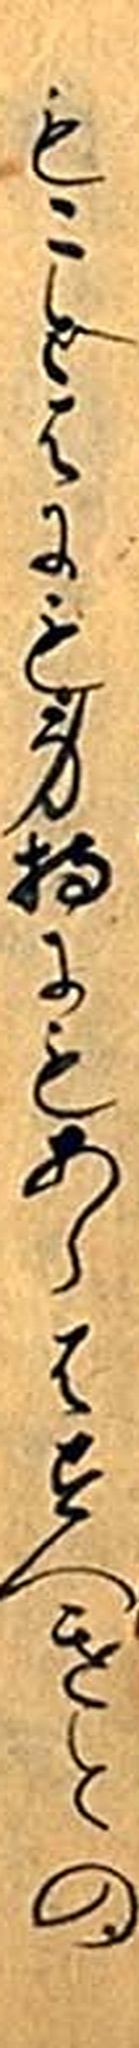もことはにも身持にもあらはすへきとの
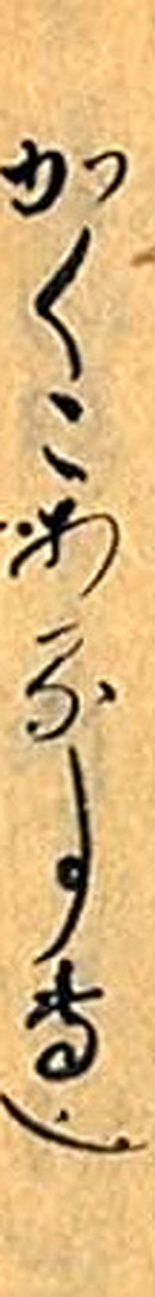かくこある事専也
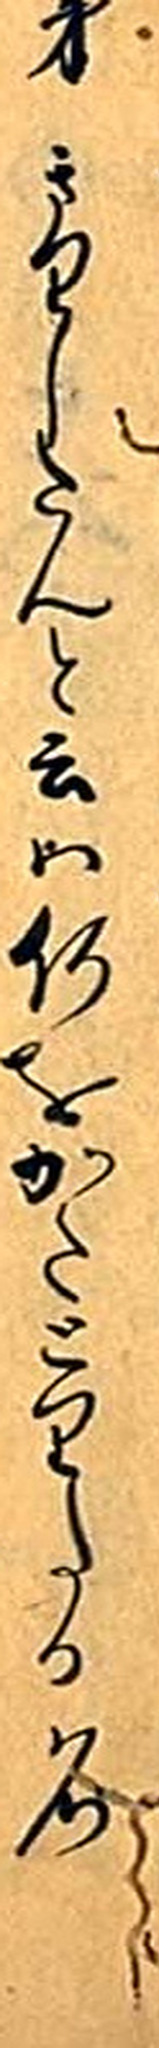弟きりしたんと云は何をかたとりたる名
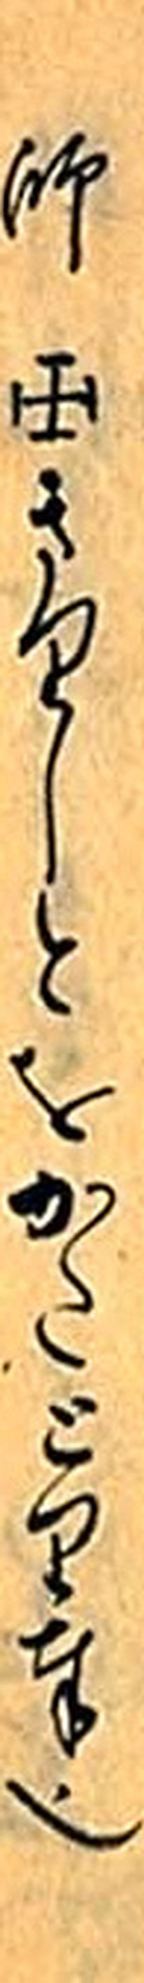師☩きりしとをかたとり奉也
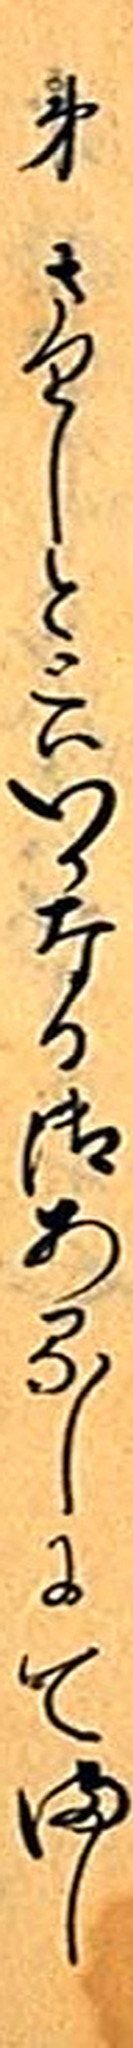弟きりしととはいかなる御あるしにてまし
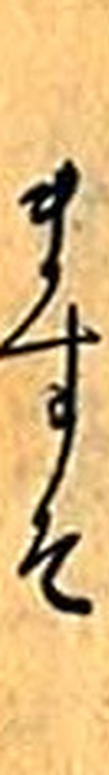ますそ
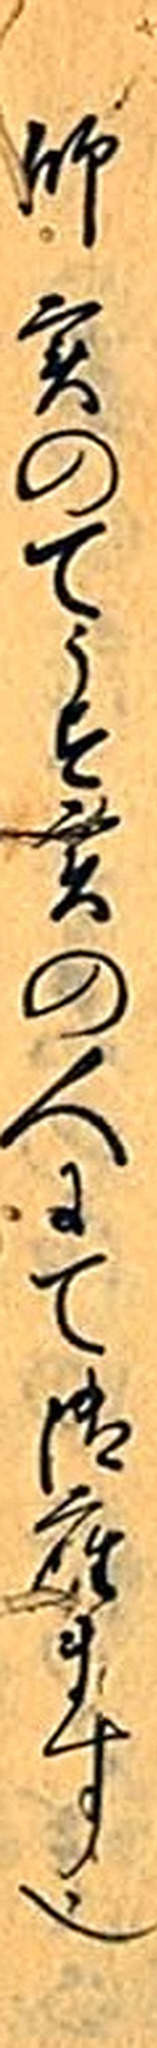師実のてうす実の人にて御座ます也
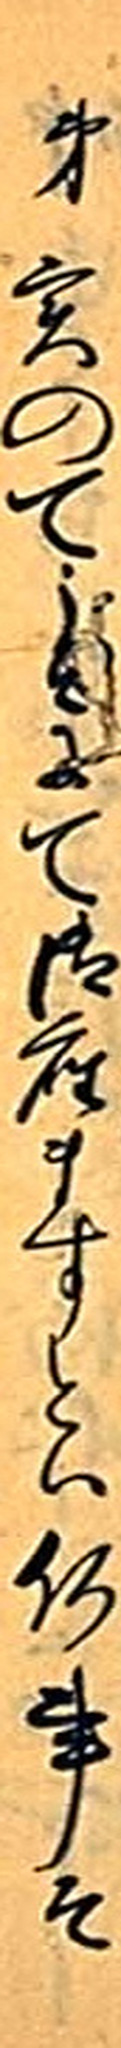弟実のてうすにて御座ますとは何事そ
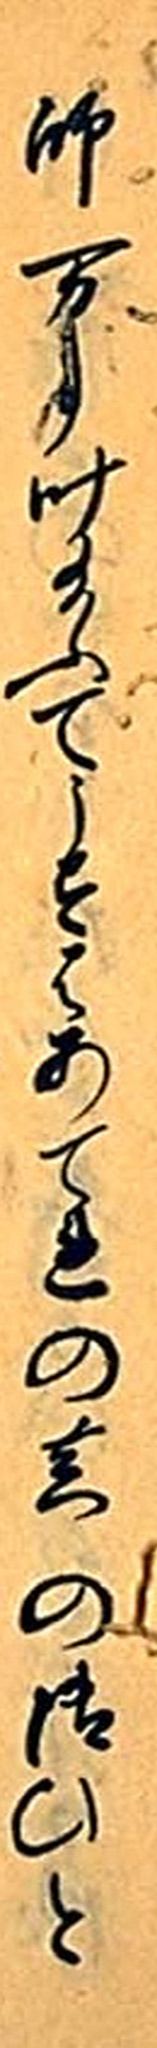師万事叶給ふてうすはあてれの真の御ひと
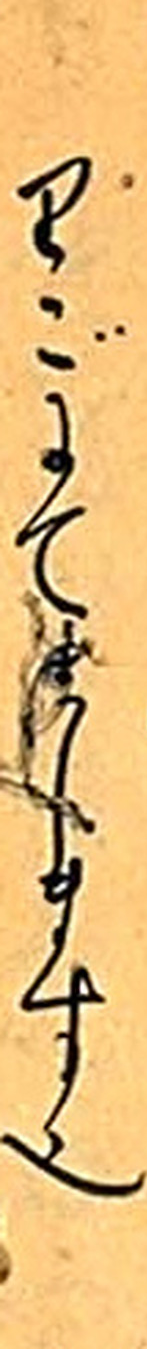りごにてまします也
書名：ドチリナ・キリシタン
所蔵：東京大学総合図書館 / General Library in the University of Tokyo
